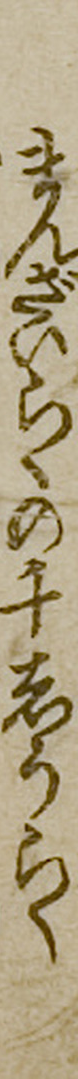まんざいらくの千しうらく
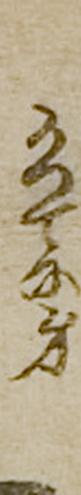かつてに身
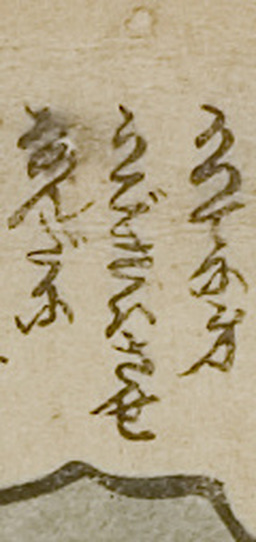うごきハさせ
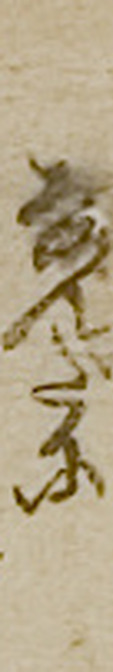なんだに
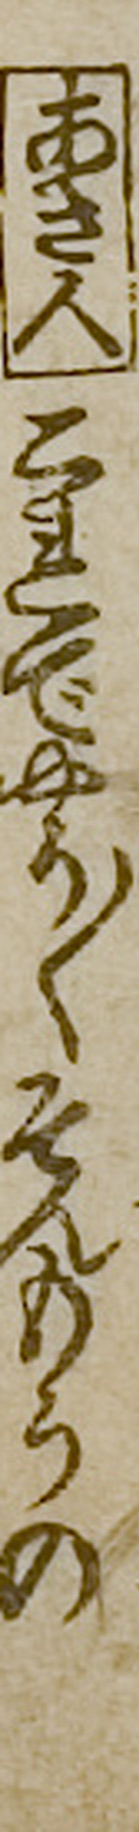あき人「これでやう〳〵そんもうの
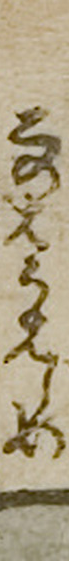このはうはじめ
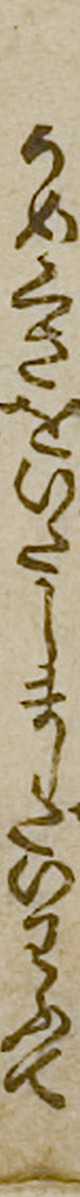うめくさをいたしましたいわふて
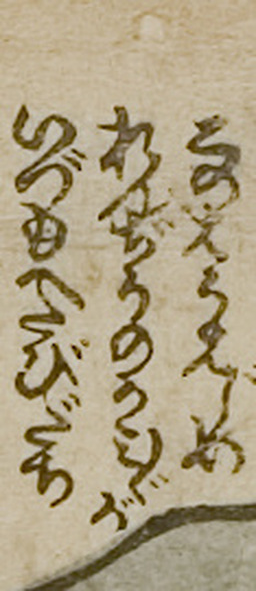れんぢうのかミ〴〵が
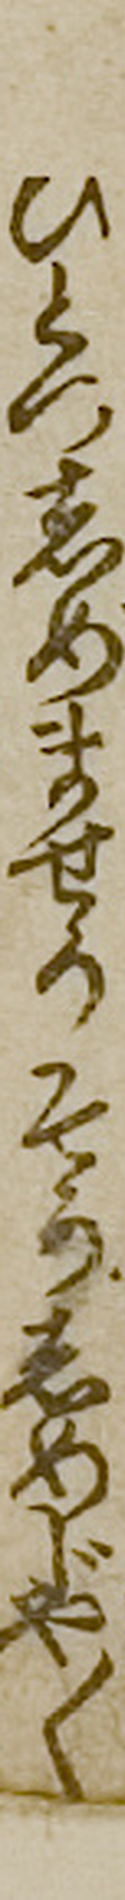ひとつしめませうそうしめじや〳〵
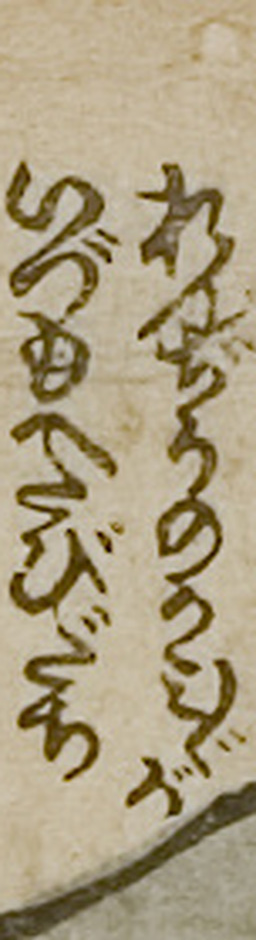いづもへたびだち
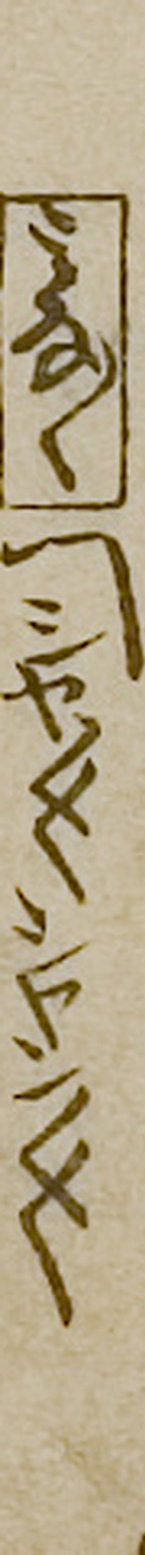ミな〳〵「シヤ〳〵〳〵シヤン〳〵〳〵
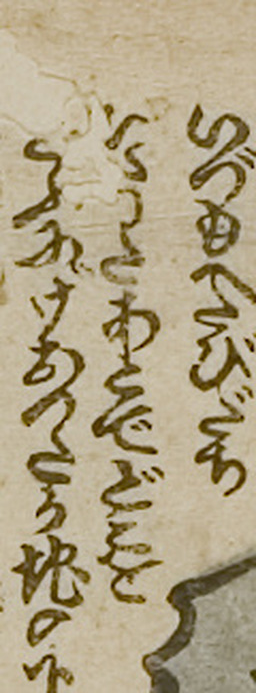いたしたあとでどこを
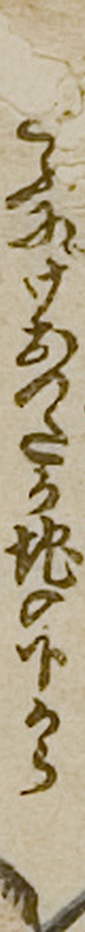どふにげおつたか地の下から
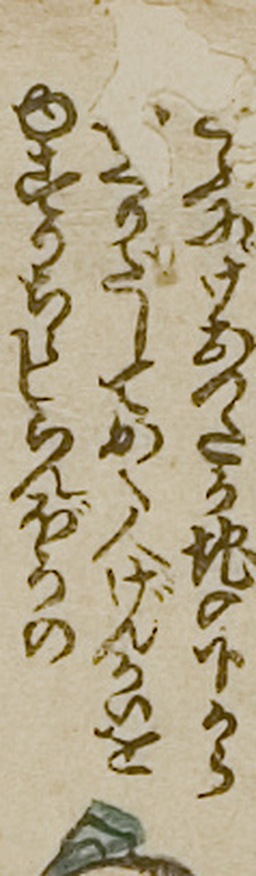むくりだしてかく人げんかいを
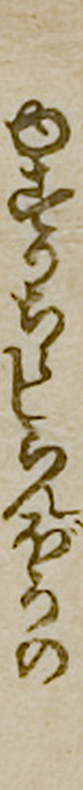ゆすりちらしらんぼうの
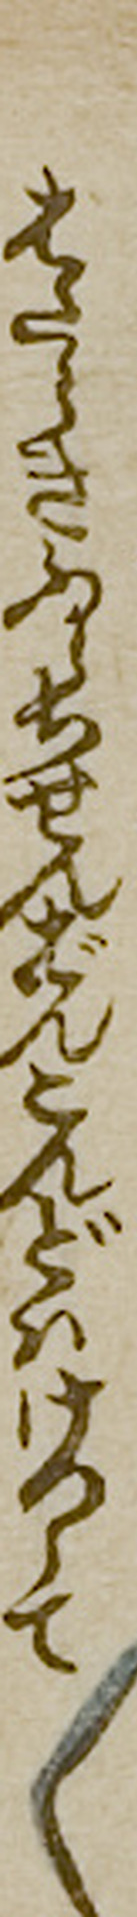はたらきふらちせんばんこんどハけつして
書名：おそろ感心要石
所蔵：東京大学総合図書館 General Library in the University of Tokyo, JAPAN
